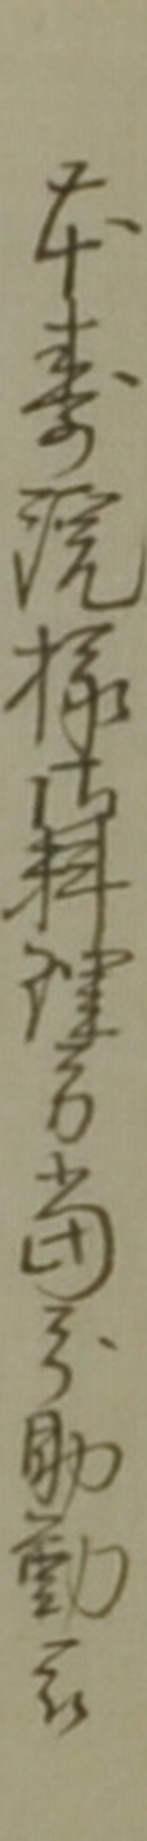本寿院様御料理方当分助勤被
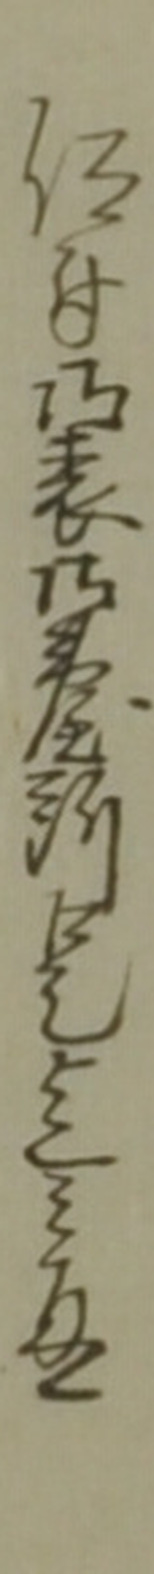仰付御表御台所是迄之通
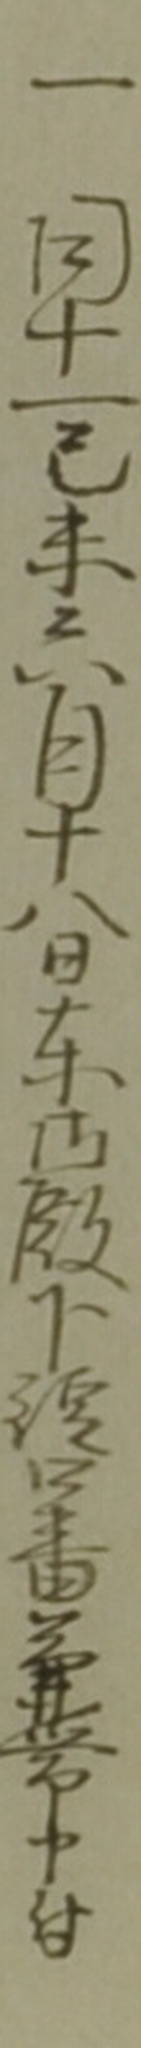一同十一己未六月十八日東御殿下錠口番兼帯申付
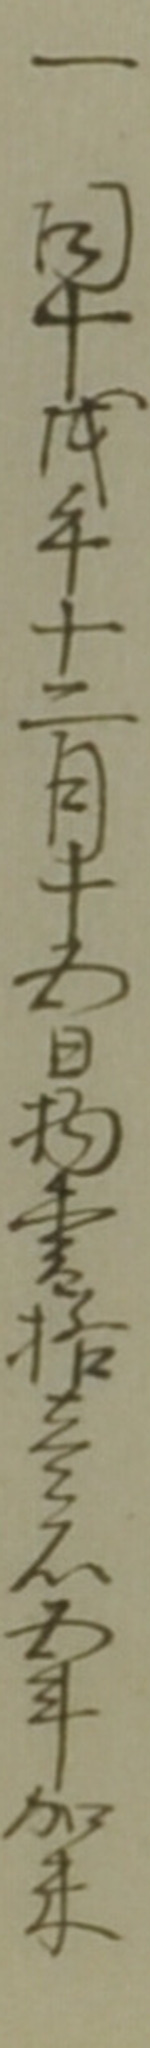一同十戊午十二月十五日物書格壱石五斗加米
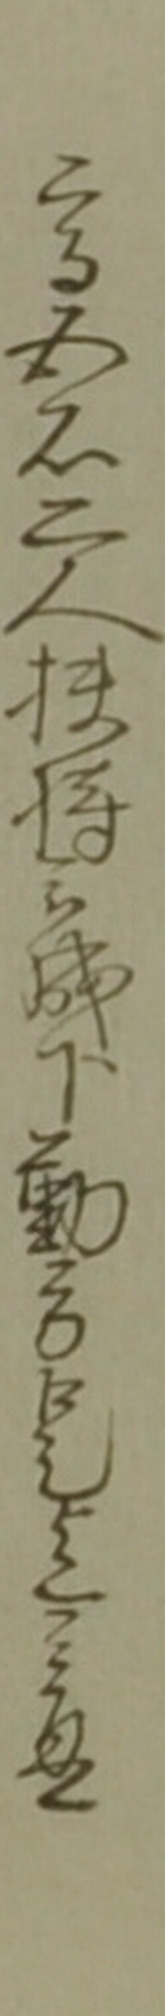高五石二人扶持被成下勤方是迄之通
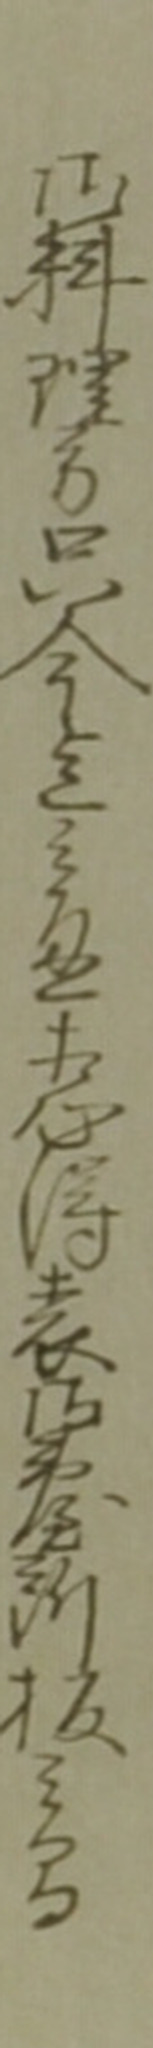御料理方只今迄之通相心得表御台所板之間
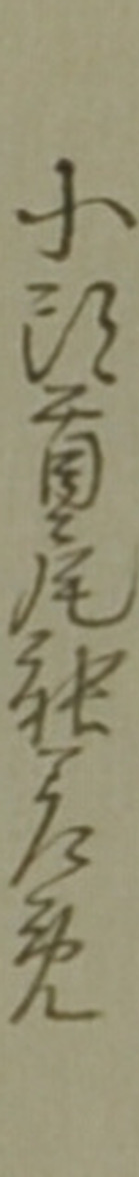小頭首尾能差免
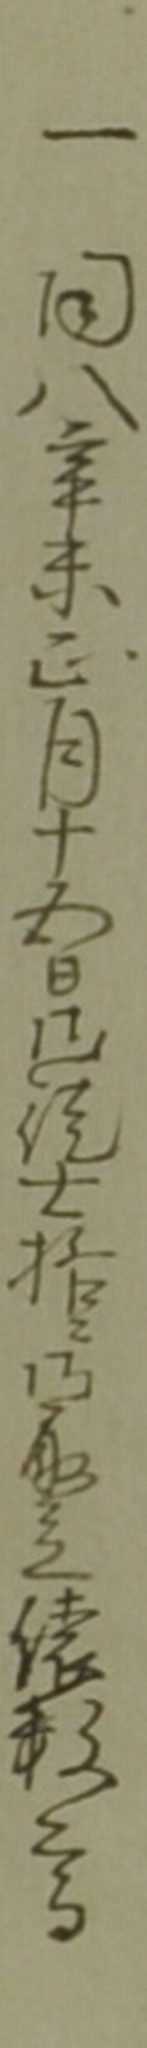一同八辛未正月十五日御徒士格御取立俵数高
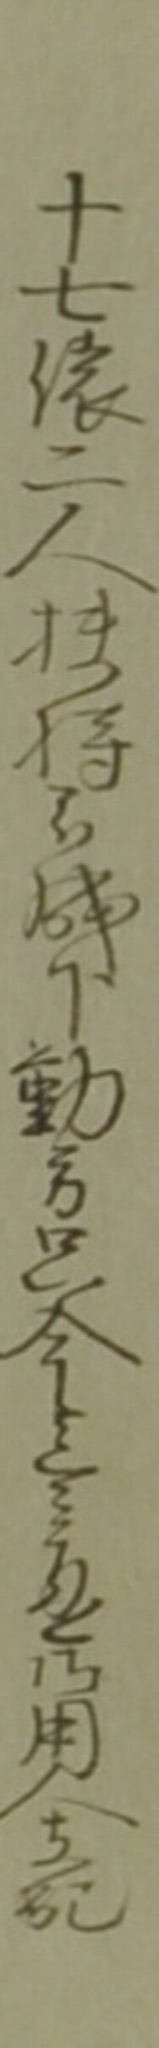十七俵二人扶持被成下勤方只今迄之通御用人支配
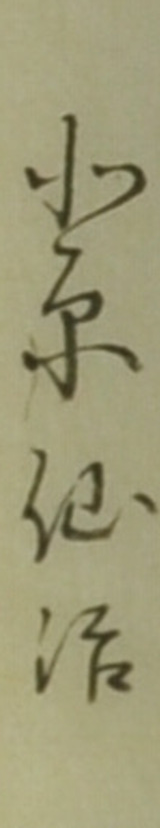北原仙治

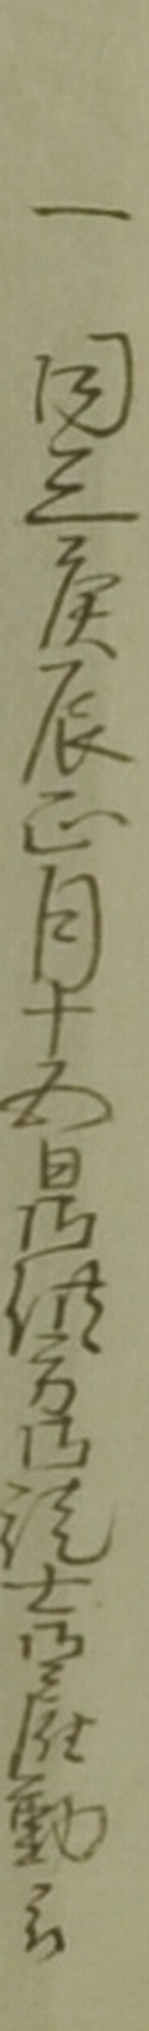一同三庚辰正月十五日御供方御徒士御雇勤被
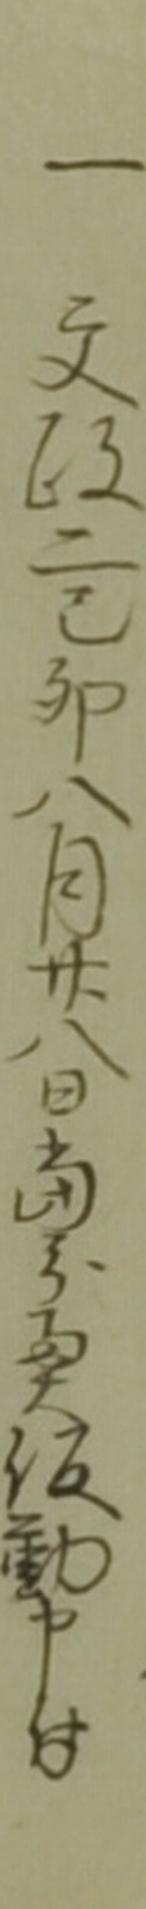一文政二己卯八月廿八日当分奥仮勤申付
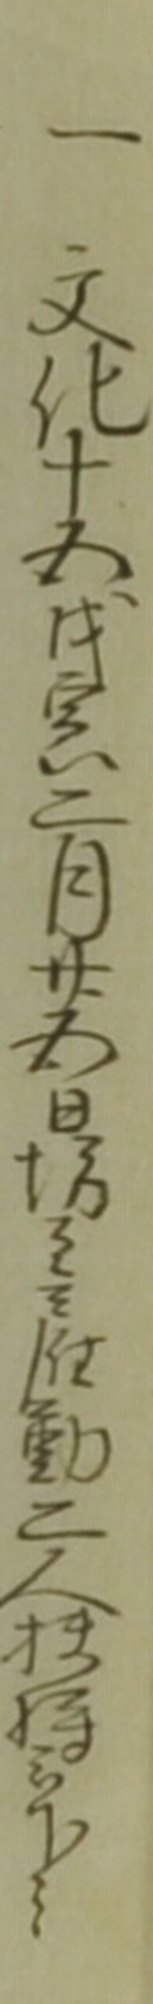一文化十五戊寅二月廿五日坊主雇勤二人扶持被下之
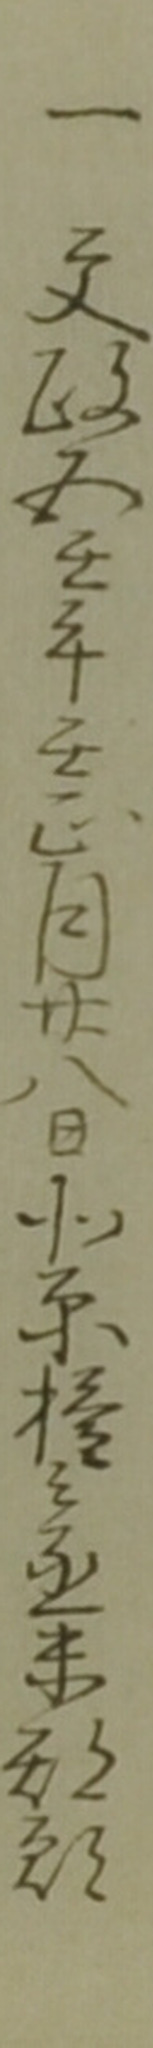一文政五壬午閏正月廿八日北原権之丞末期願
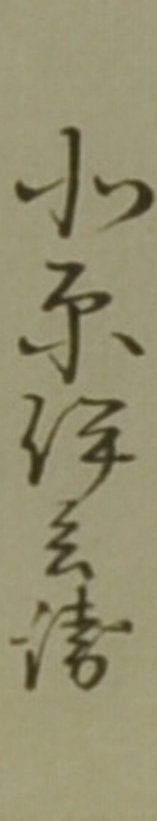北原伊兵衛
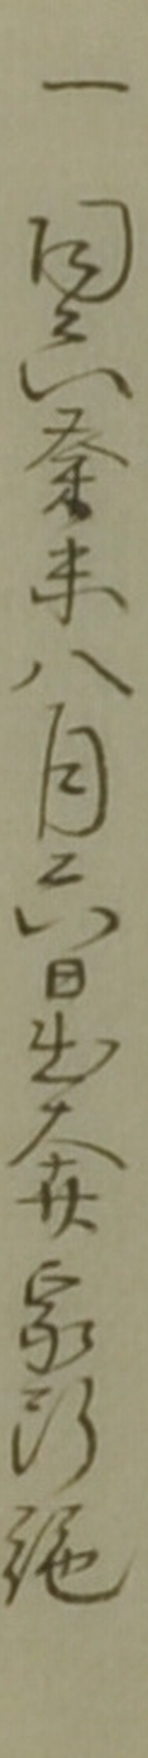一同六癸未八月六日出奔家断絶
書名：無足廃家（弐）
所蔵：伊那市立高遠町図書館・合同会社AMANE
